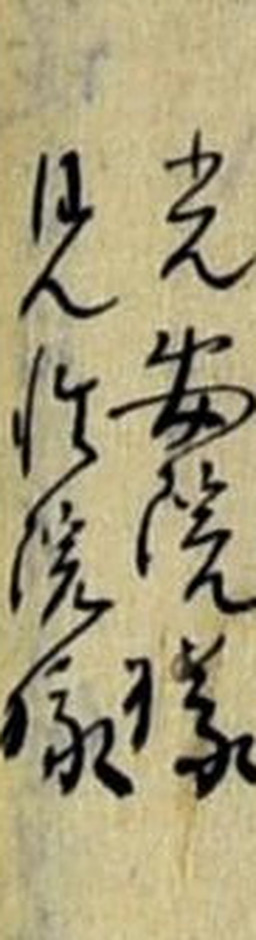見性院様
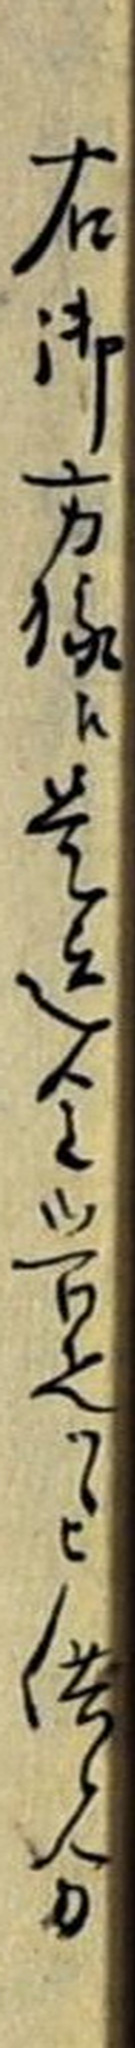右御方様江是迄金弐百疋つヽ被供候分
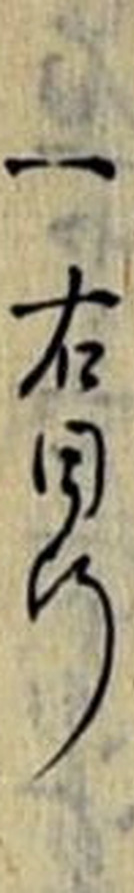一右同断
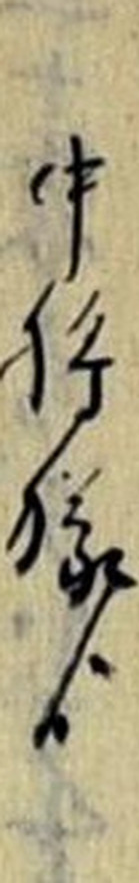中将様ゟ
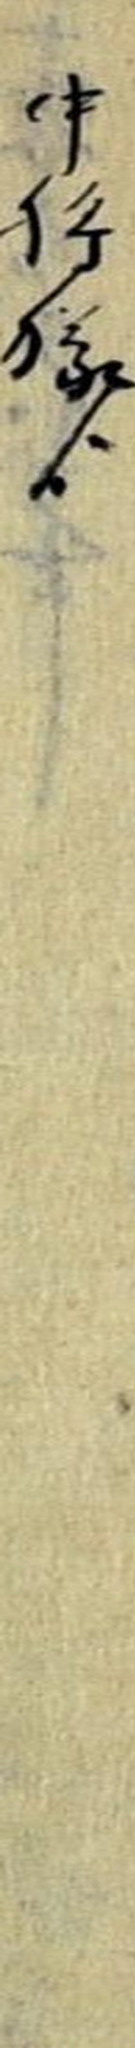中将様ゟ
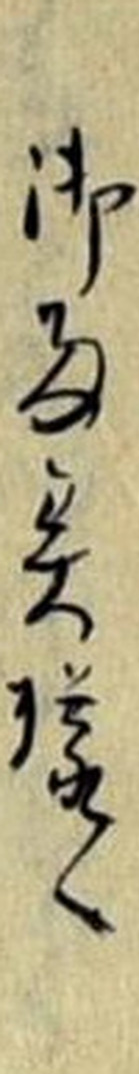御両霊様へ
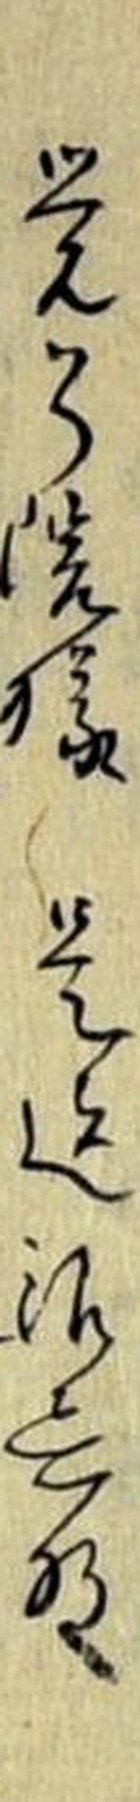覚了院様是迄銀壱枚
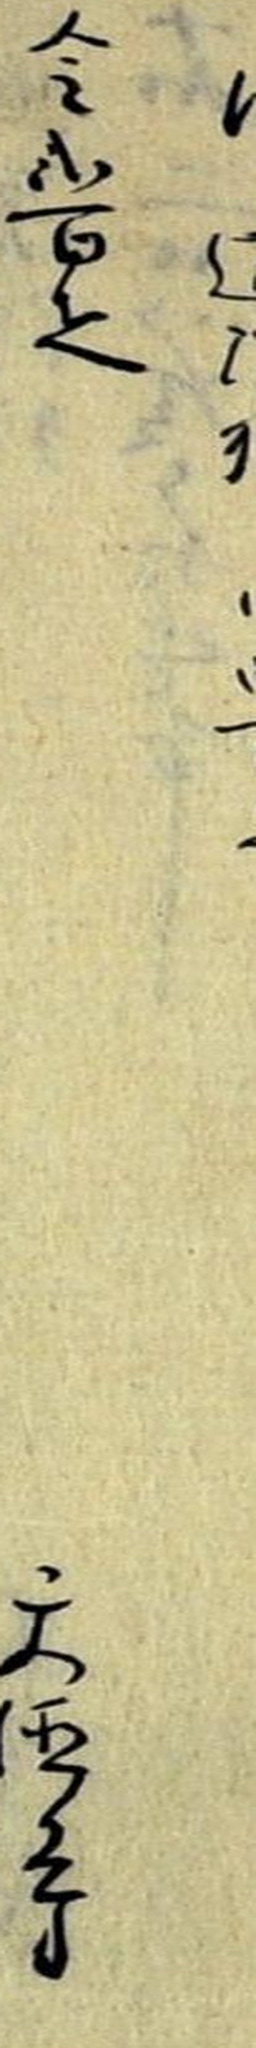金弐百疋天徳寺
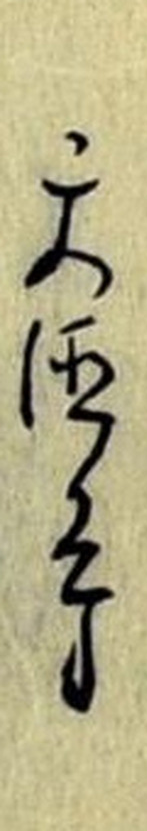天龍寺
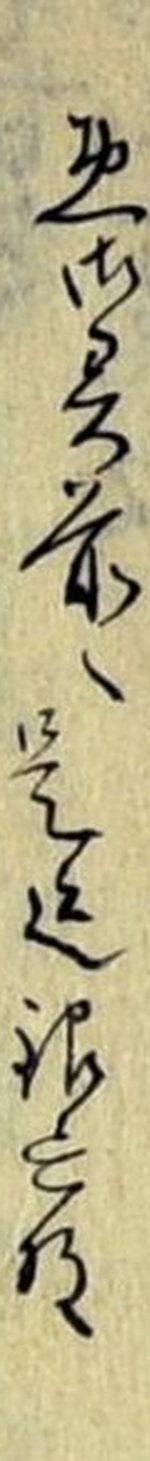惣御霊前へ是迄銀壱枚
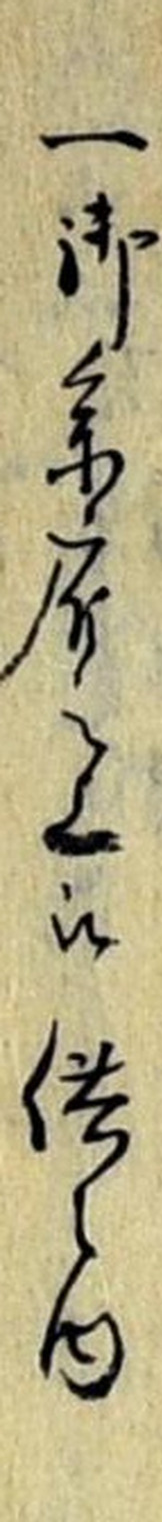一御参府之上被供之内
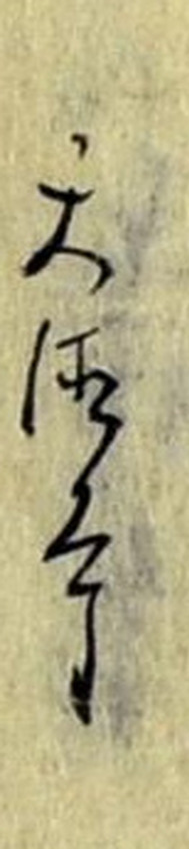天龍寺
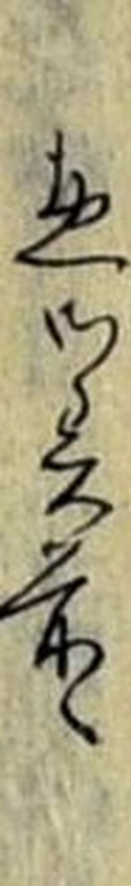惣御霊前へ
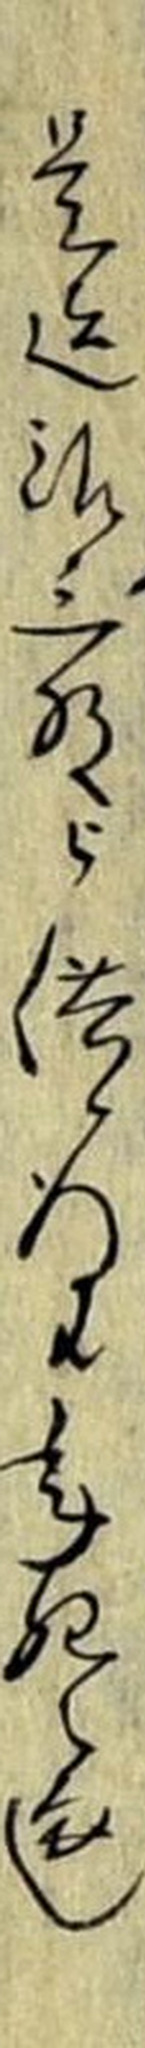是迄銀三枚被供候得共年始之通
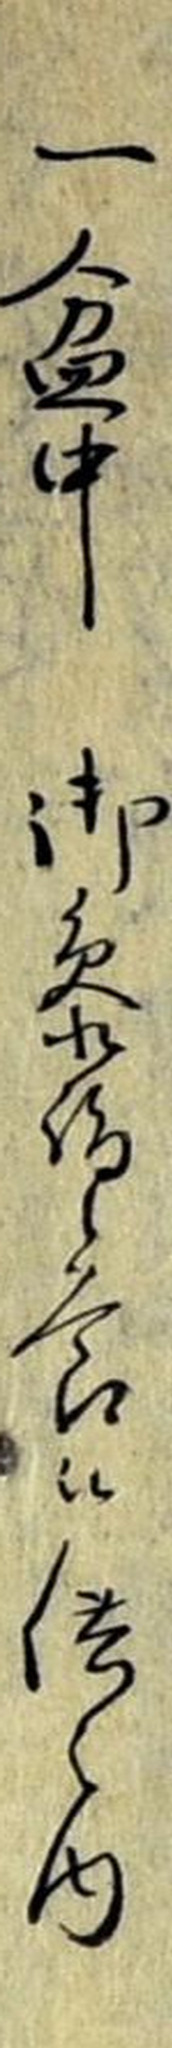一盆中御参詣之節被供之内
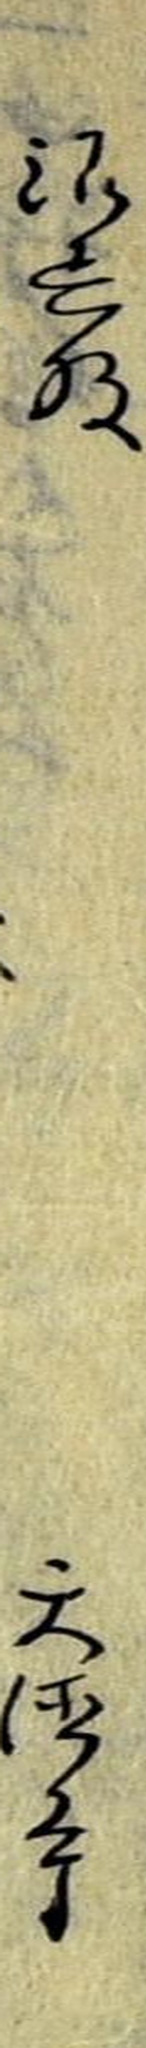銀壱枚天徳寺
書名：命令之部 四
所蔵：福井県文書館 Fukui Prefectural Archives
